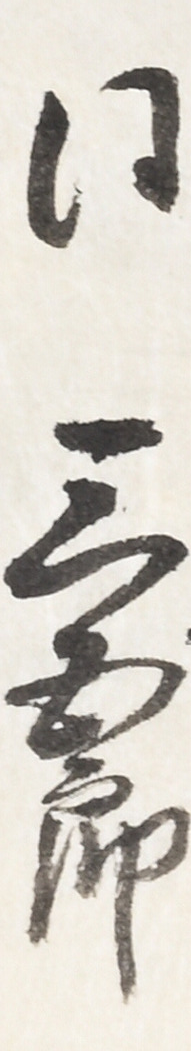同三五郎
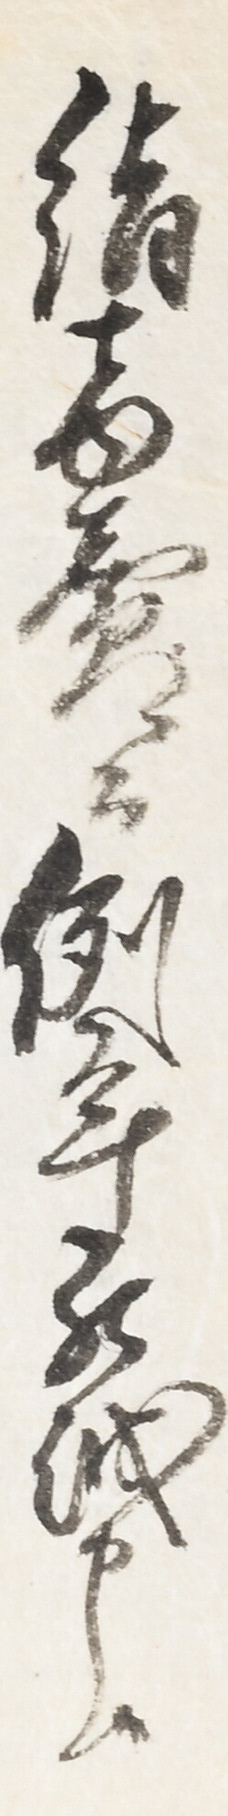絹商売ニ而例年罷越申候
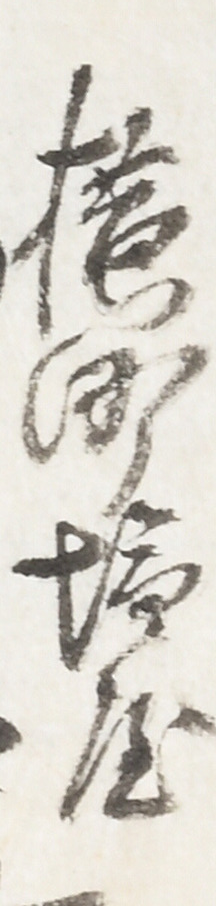横町塩屋
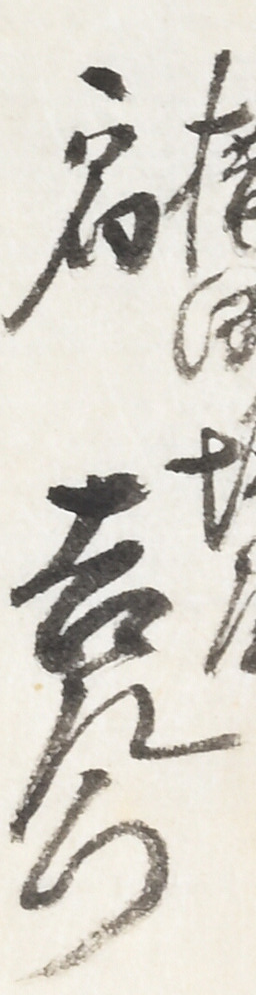宿吉左衛門
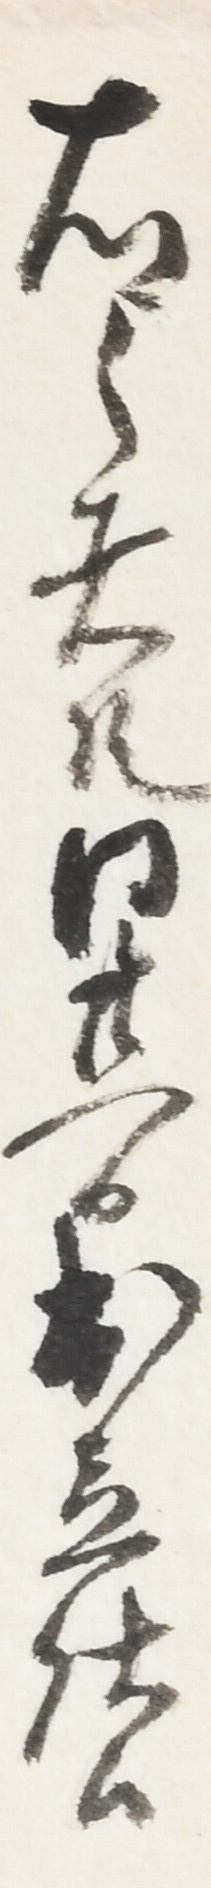右之者共同廿一日出立仕候
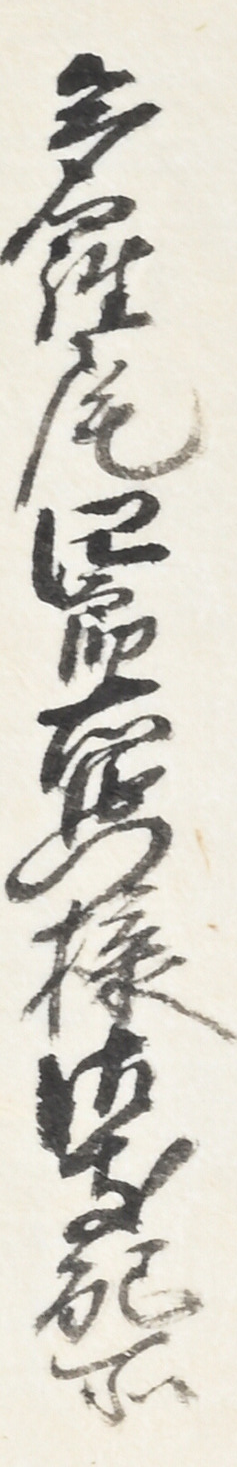多羅尾四郎右衛門様御支配所
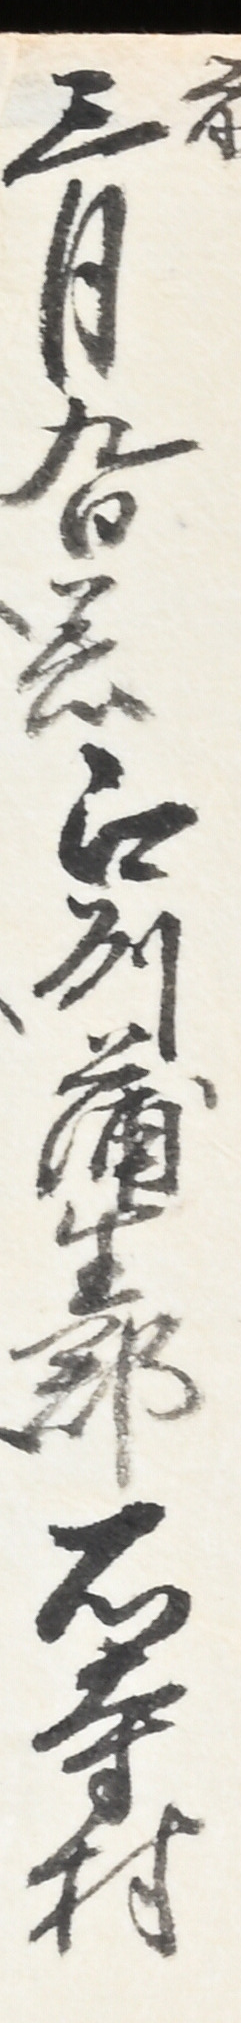三月九日着江州蒲生郡石寺村
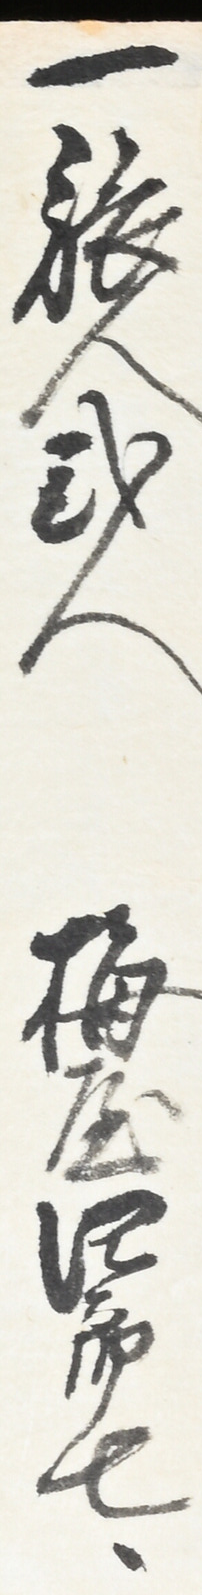一旅人弐人梅屋四郎七・
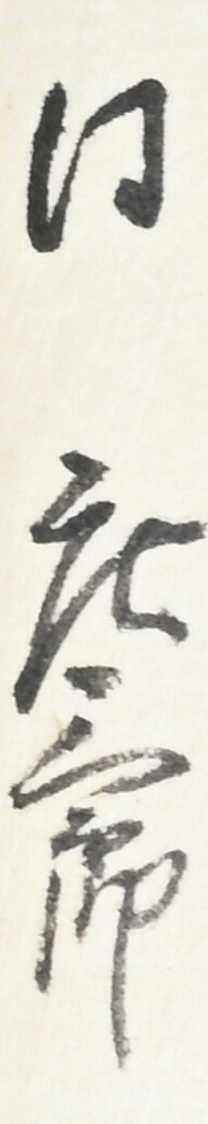同庄三郎
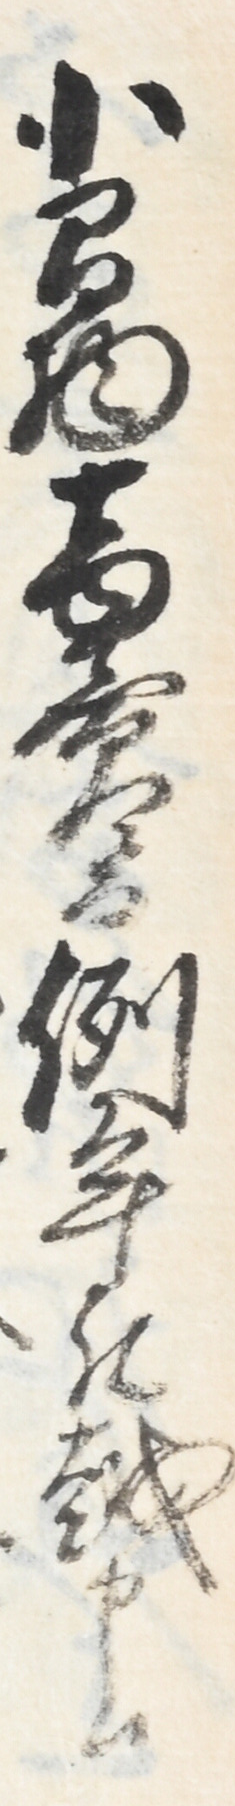小間物商売ニ而例年罷越申候
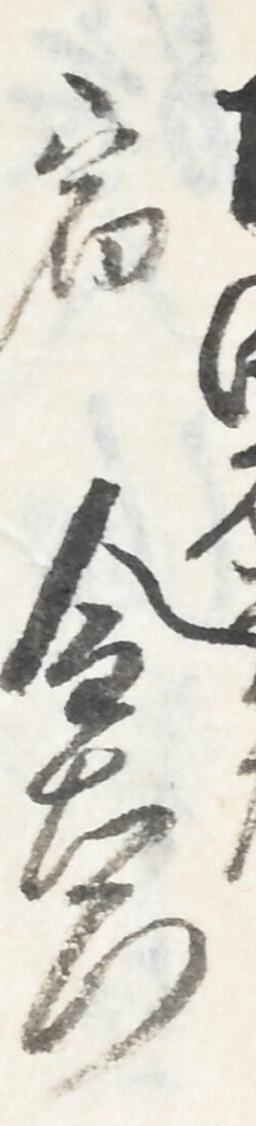宿常右衛門
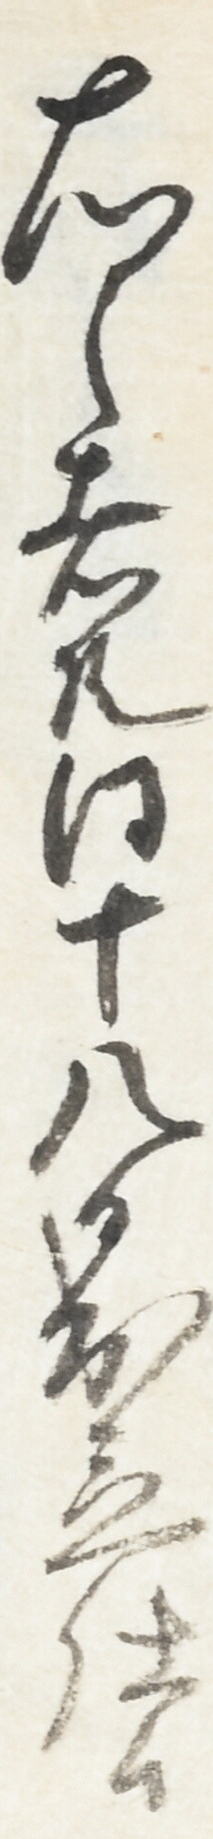右之者共同廿一日出立仕候

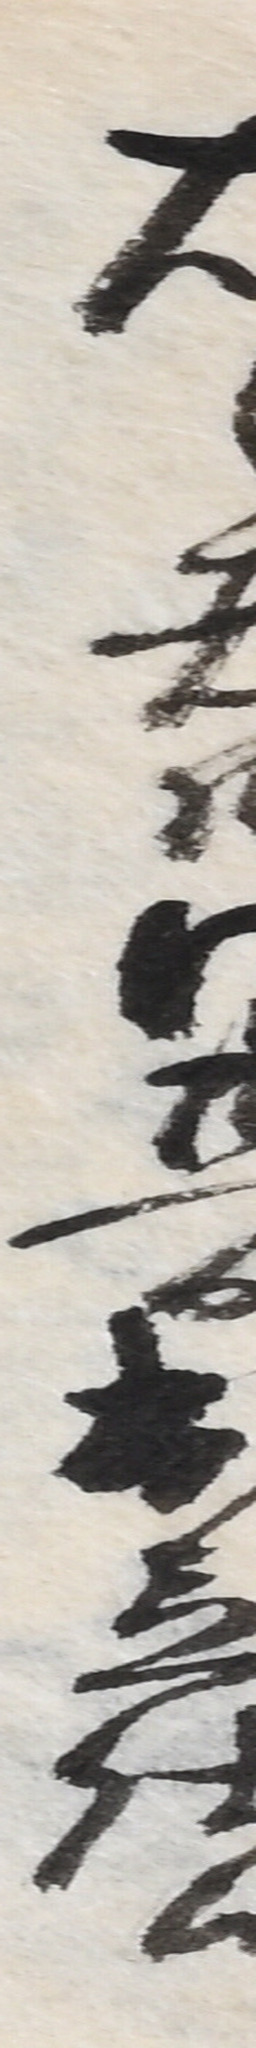右之者共同十八日出立仕候
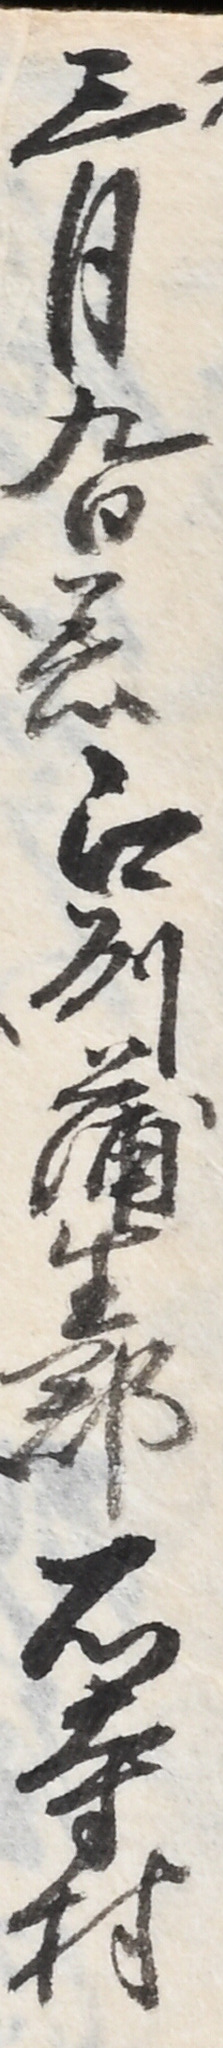三月十八日着江州神崎郡石馬寺村
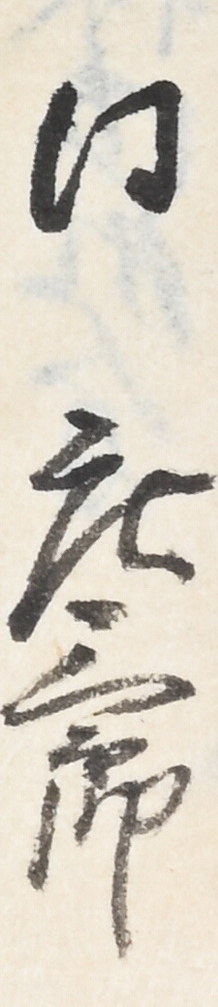同多三郎
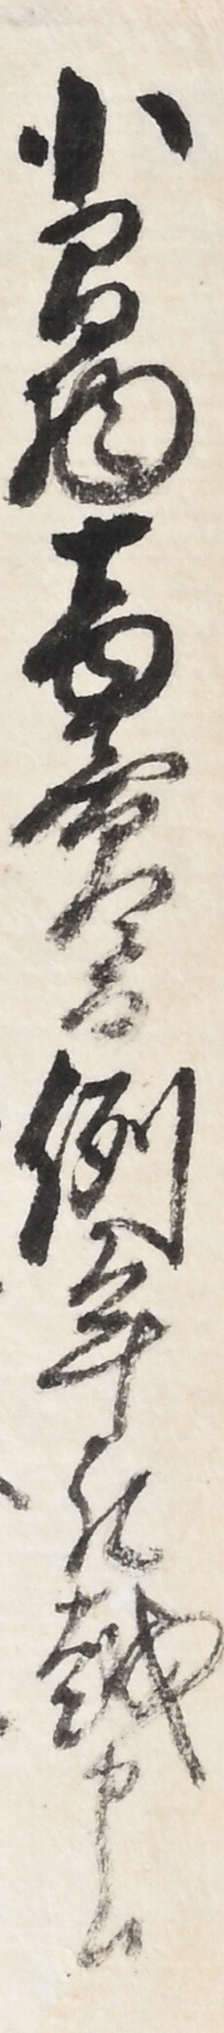小間物商売ニ而例年罷越申候
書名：旅人泊控帳
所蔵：伊那市立高遠町図書館・合同会社AMANE
